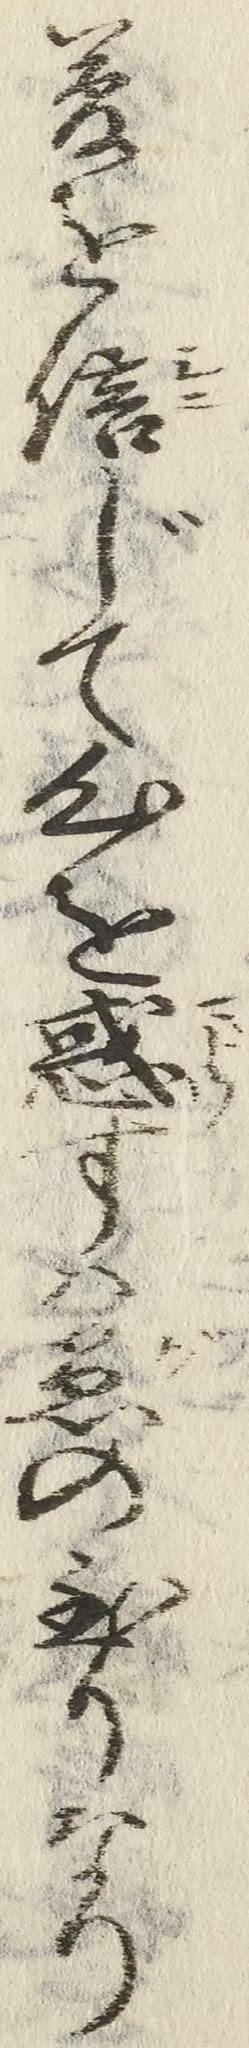夢を信じて心を惑すは愚の至りなり
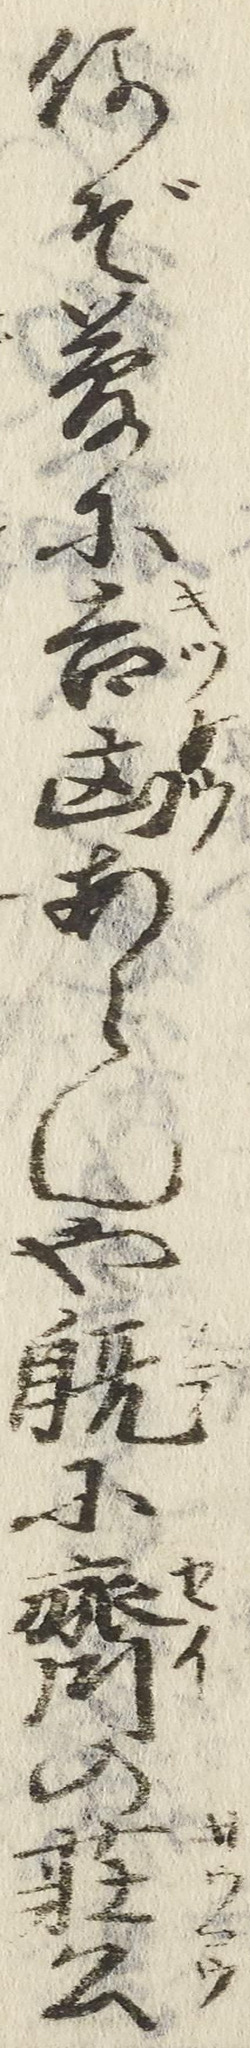何ぞ夢に吉凶あらんや既に齊の荘公
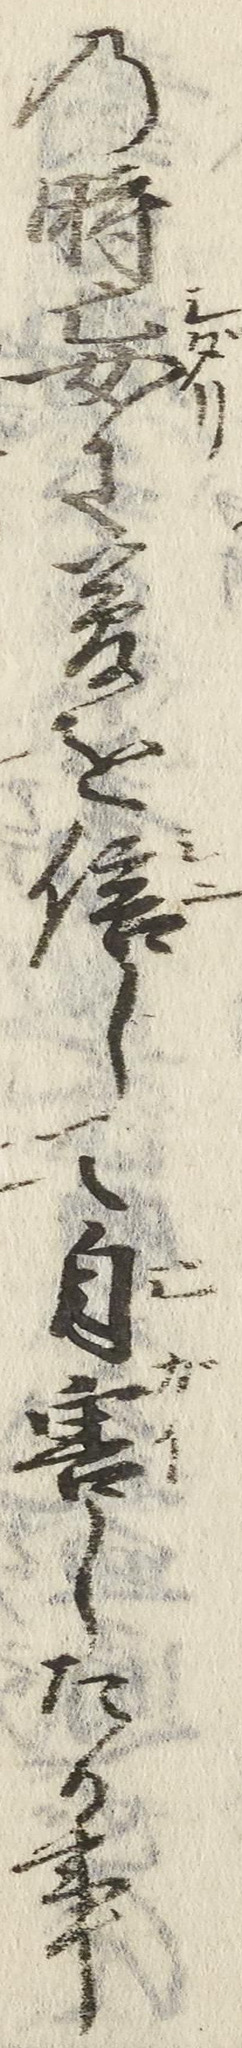の時妄に夢を信して自害したる事
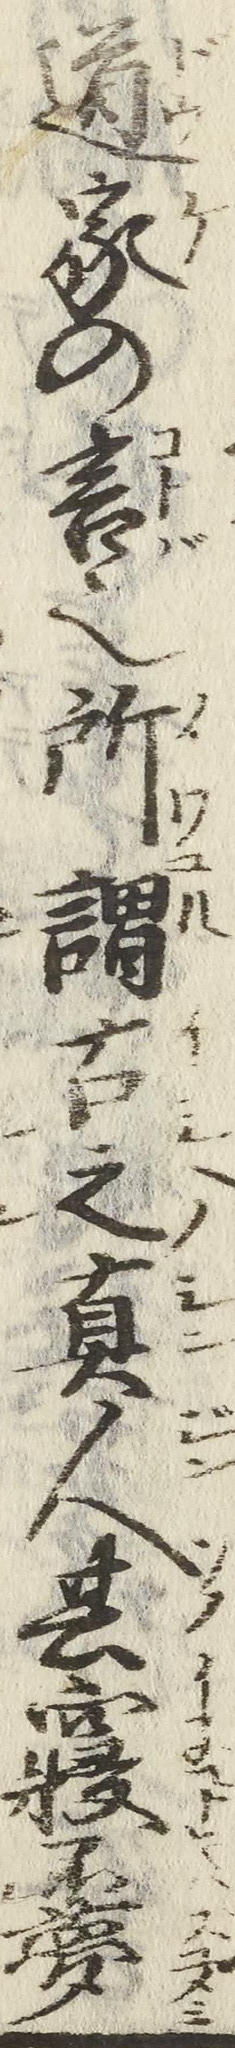の言也所謂古之真人其寝不夢
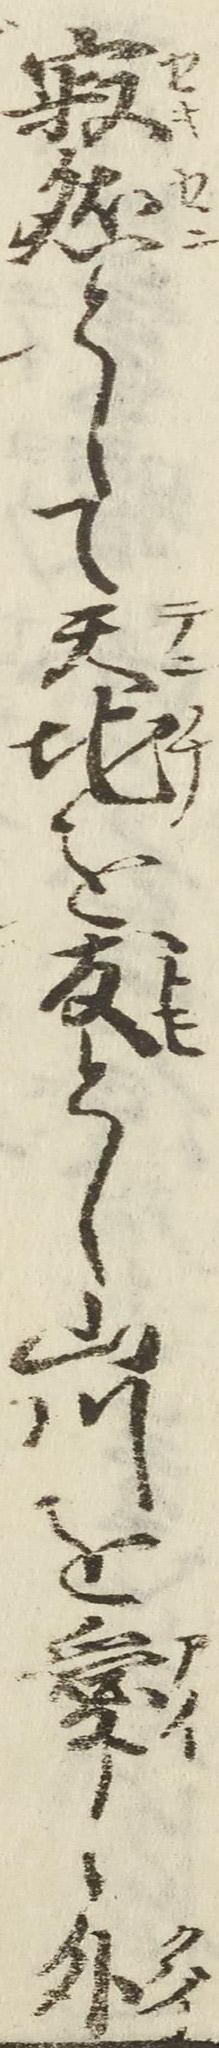寂然として天地を友とし山川を愛し外
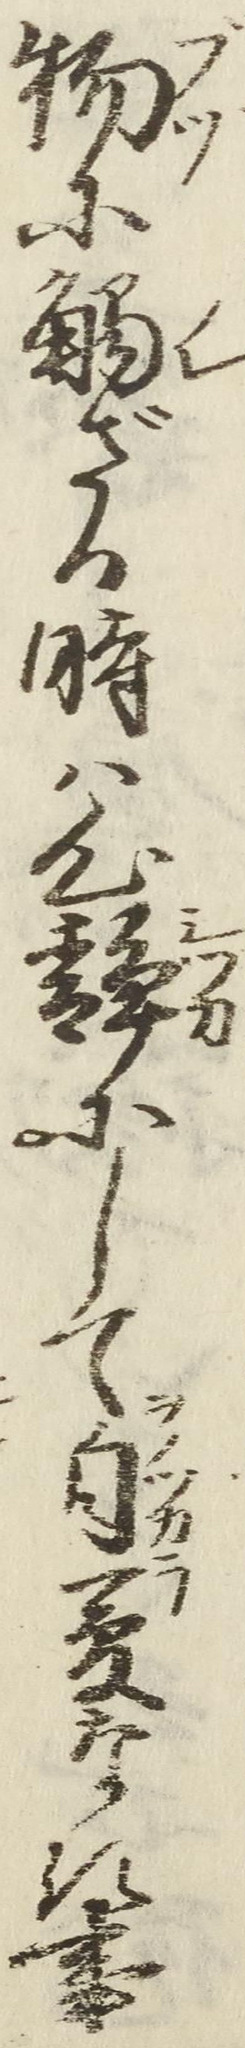物に触ざる時は心静にして自夢なる事
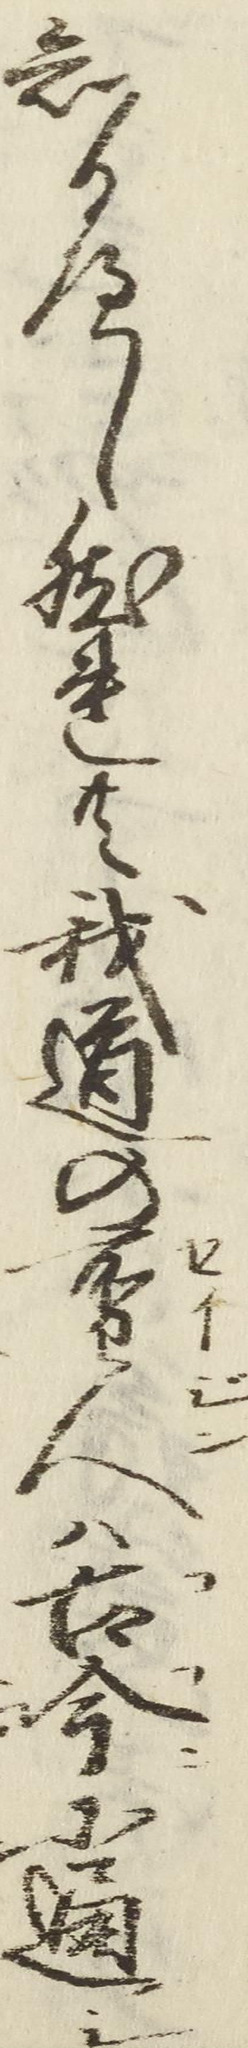知るへし然れ共我道の聖人は古今に通シ
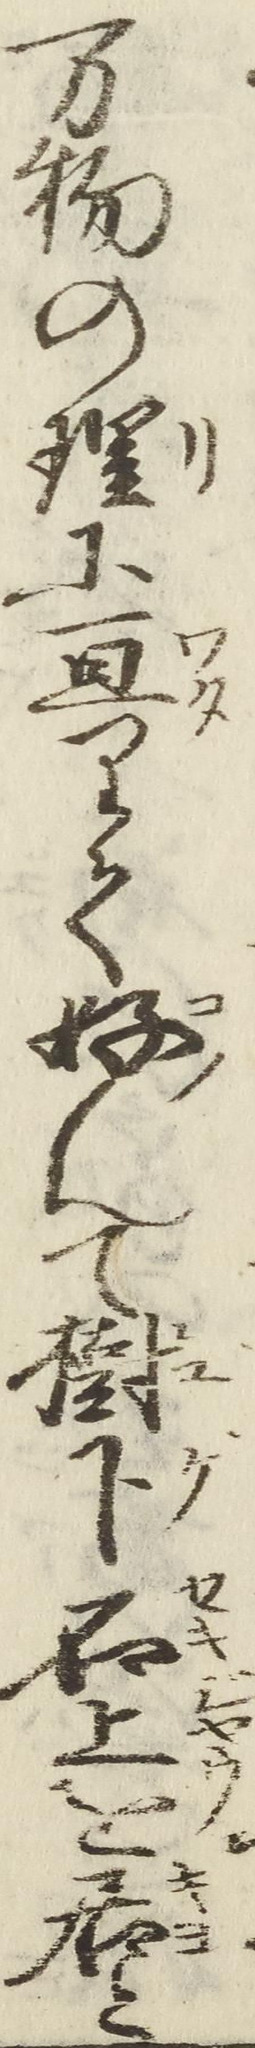万物の理に亘りて好んて樹下石上を居と
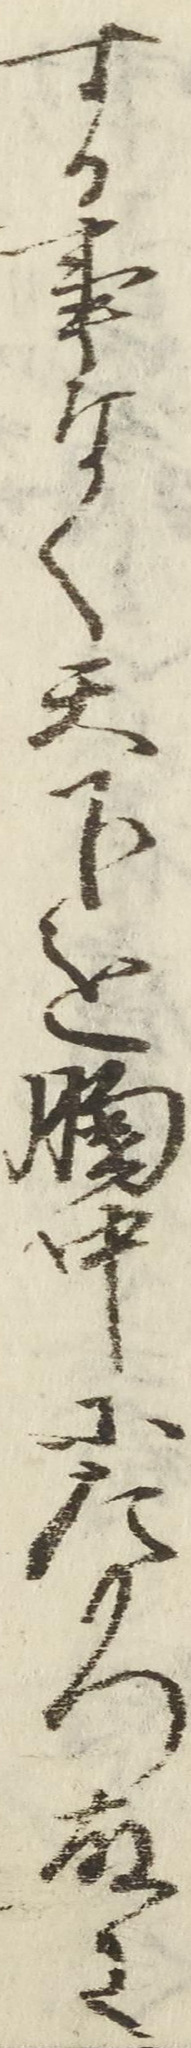する事なく天下を胸中にたもつ故に
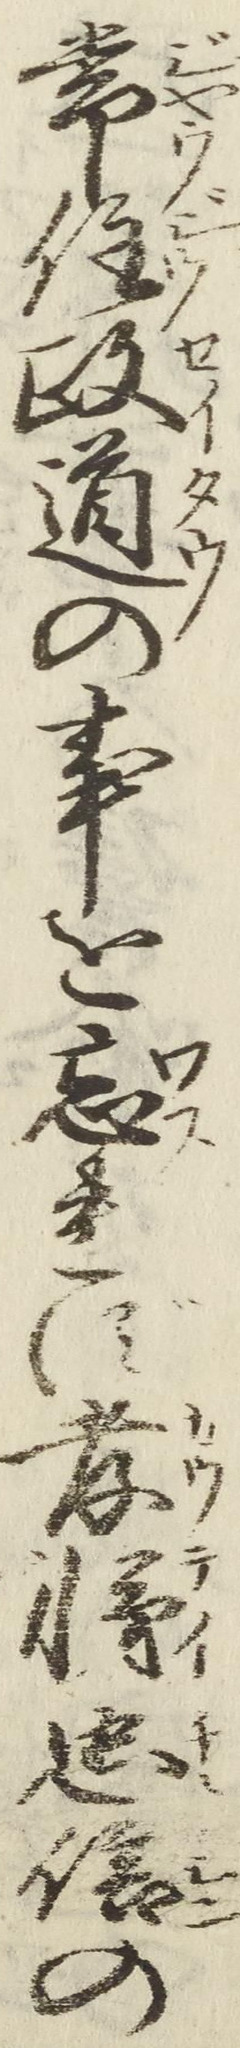常住政道の事を忘れず孝悌忠信の
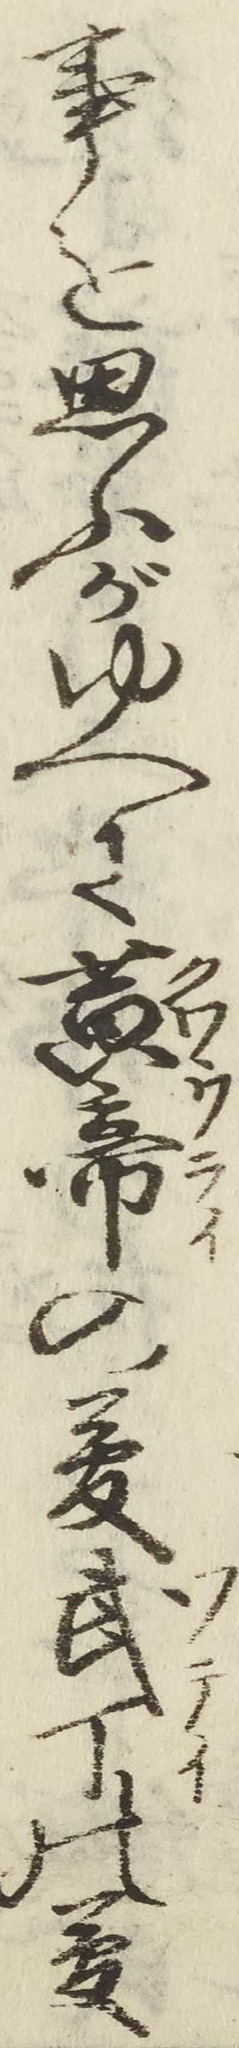事を思ふがゆへに黄帝の夢武丁の夢
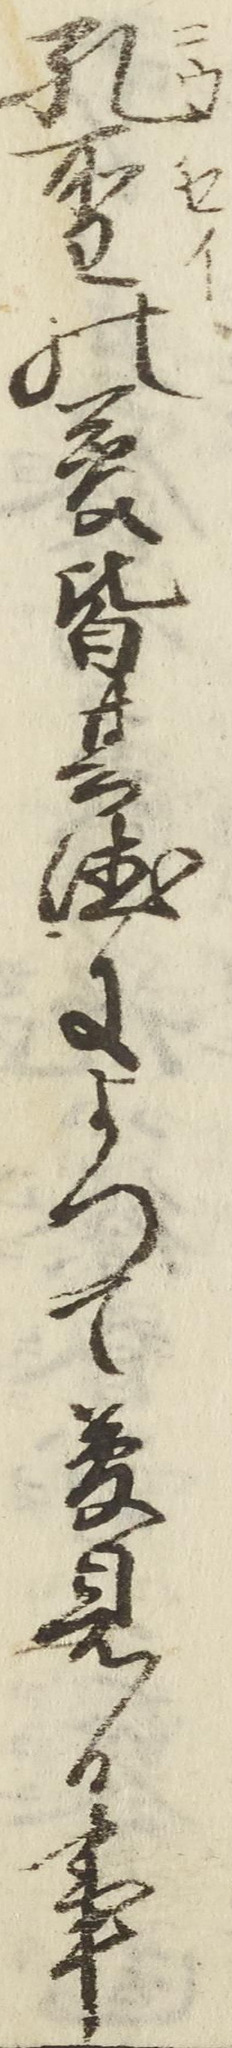孔聖の夢皆其徳によつて夢見る事

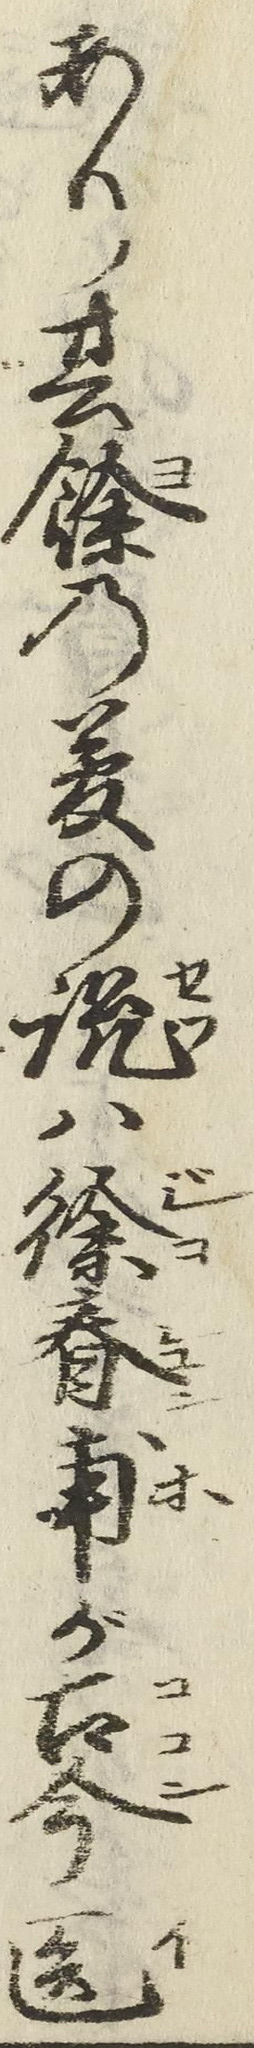あり其餘の夢の説は徐春甫が古今医
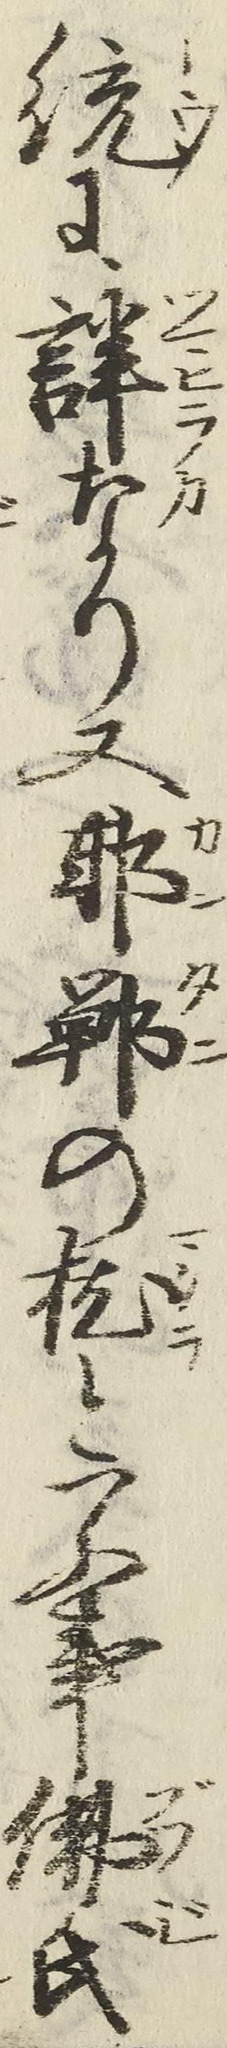統に詳なり又邯鄲の枕といふ事仏氏
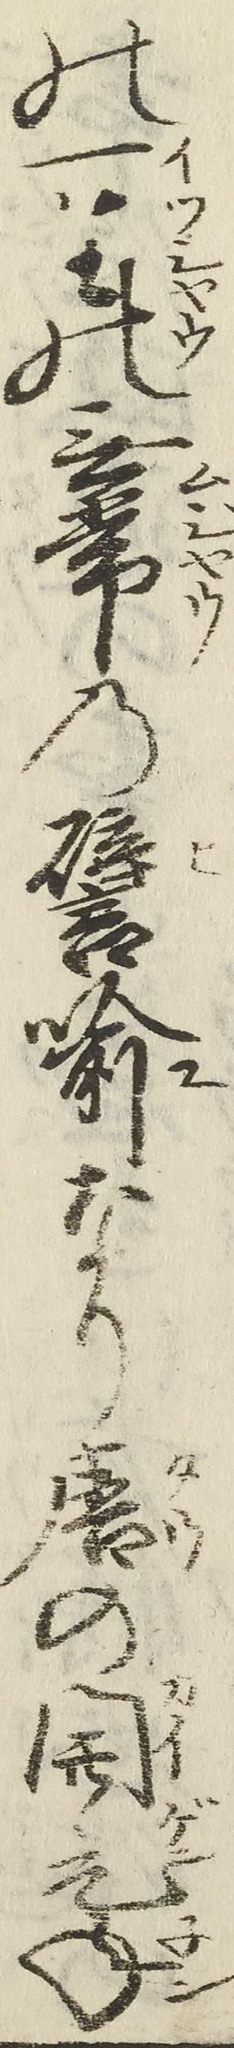の一生の無常の譬喩なり唐の開元年
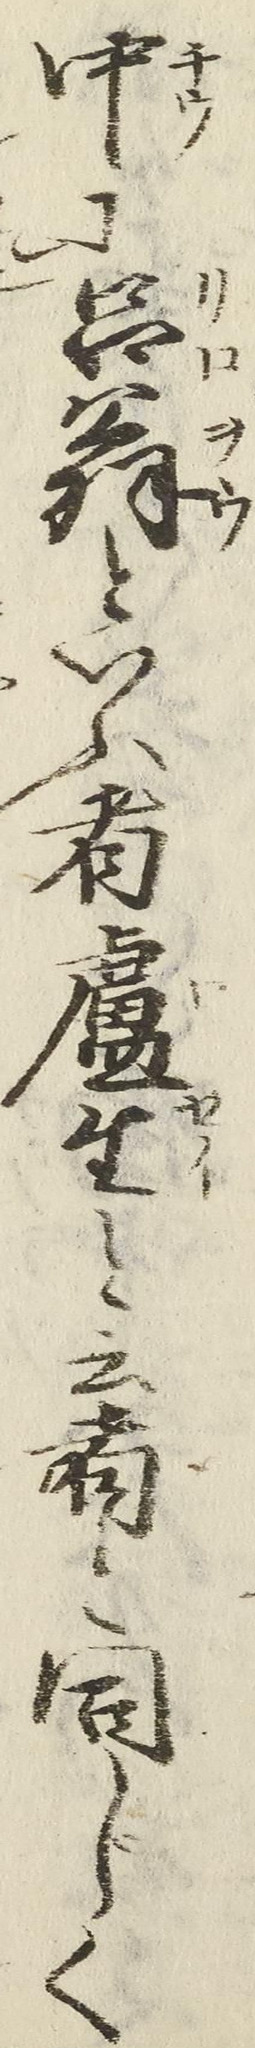中に呂翁といふ者廬生と云者と同じく
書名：天地或問珍　地
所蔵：東京大学地震研究所図書室 Earthquake Research Institute Library, The University of Tokyo, JAPAN
